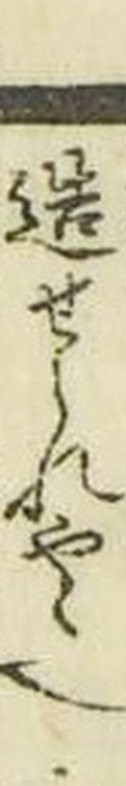造せられやゝ
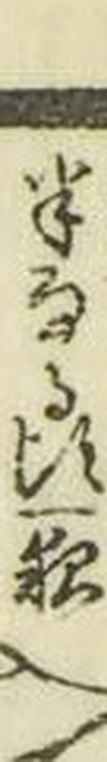半なる頃一夜
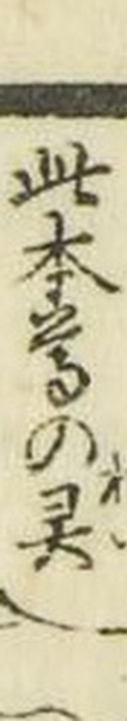此本尊の霊
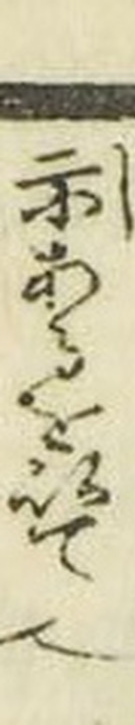示あるを以て
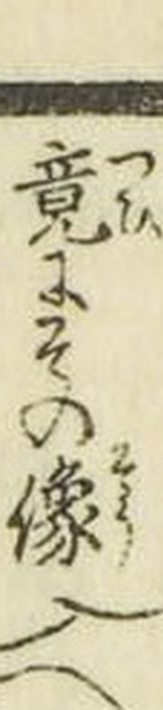竟にその像
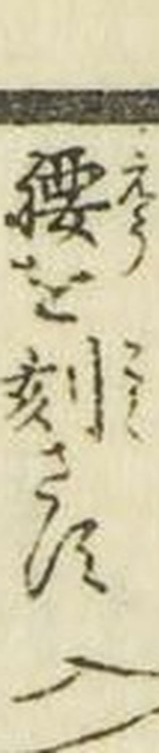腰を刻さす
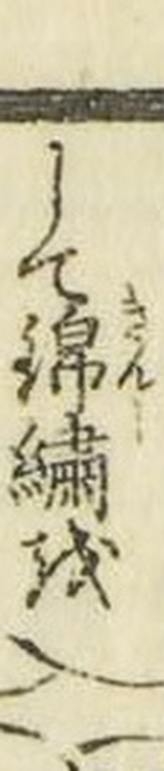して錦繍を
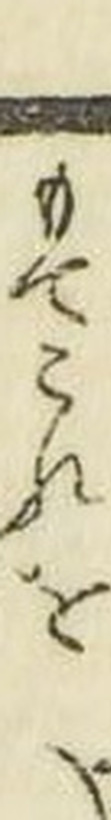もてこれを
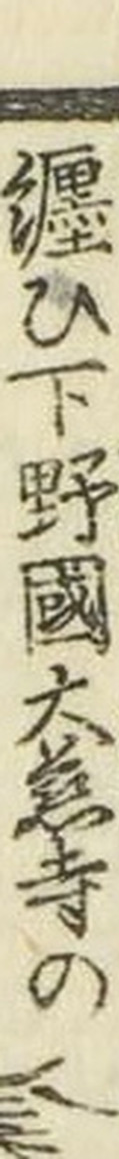纏ひ下野国大慈寺の
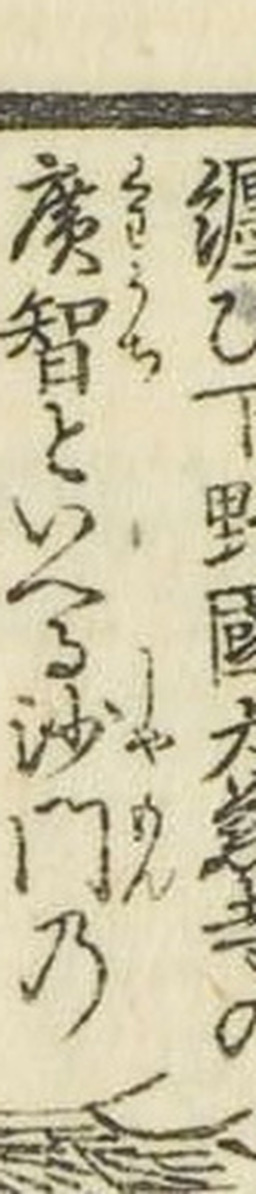広智といへる沙門の
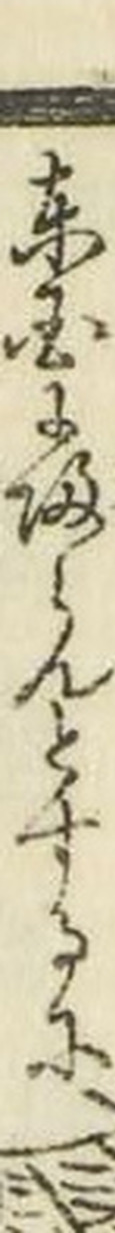東国に帰らんとするに
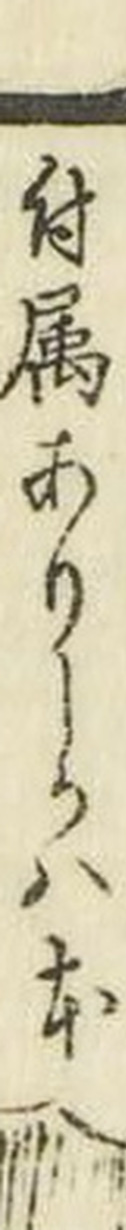付属ありしかは本
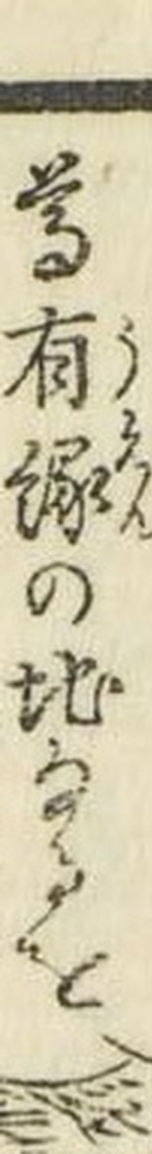尊有縁の地なるを
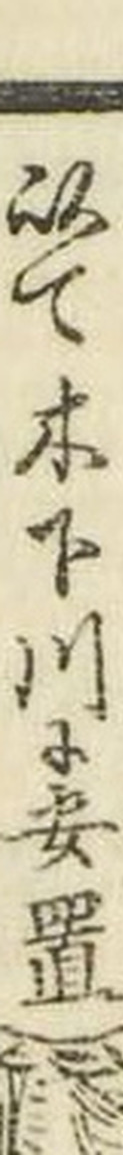以て木下川に安置
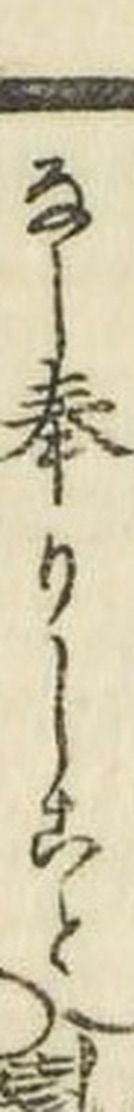なし奉りしこと
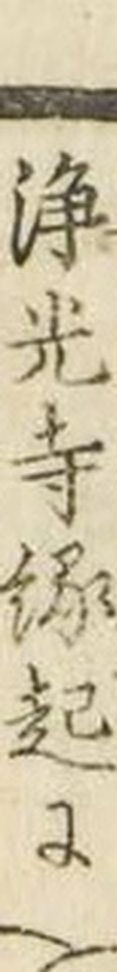浄光寺縁起に
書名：江戸名所図会 20巻 巻之19
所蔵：東京学芸大学教育コンテンツアーカイブ
